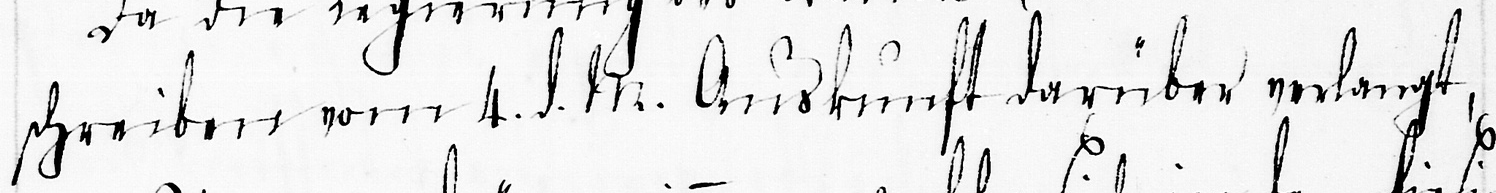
schreiben vom 4. d. M. Auskunft darüber verlangt,
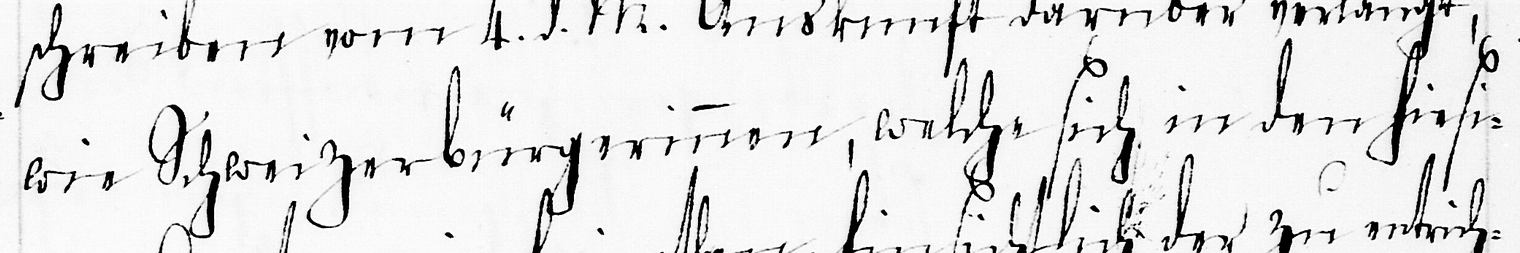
wie Schweizerbürgerinnen, welche sich in den hiesi¬
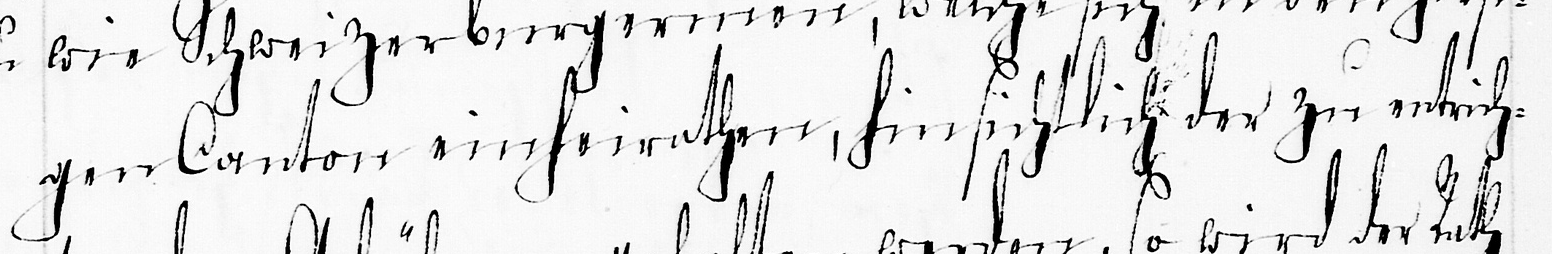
gen Canton einheirathen, hinsichtlich der zu entrich¬
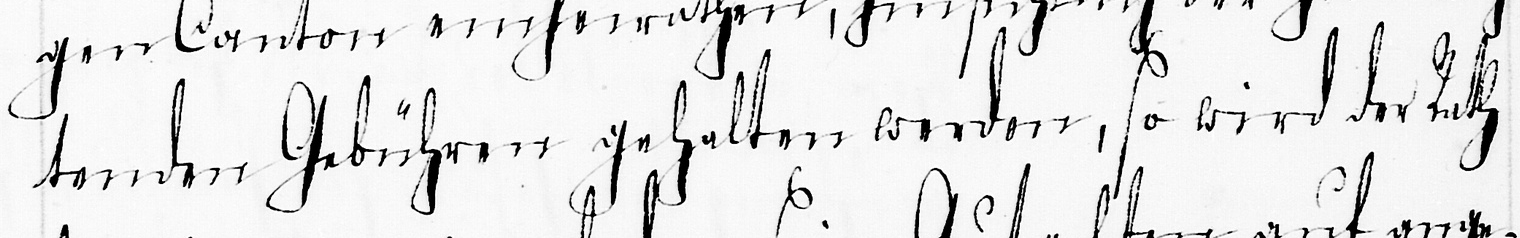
tenden Gebühren gehalten werden, so wird der Rath
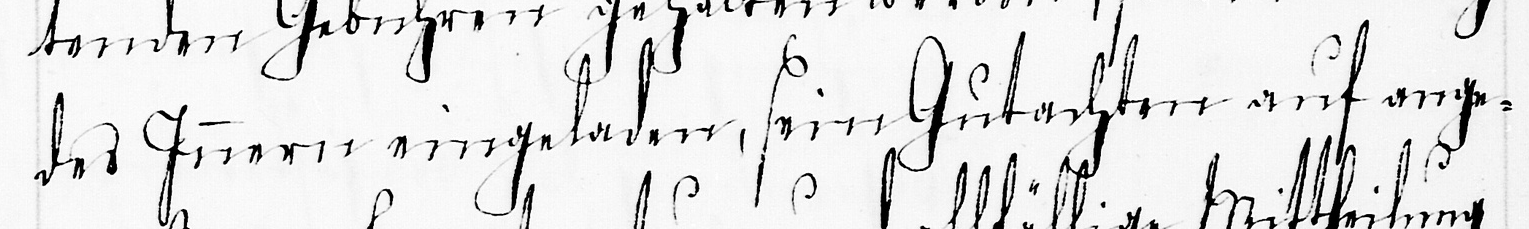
des Innern eingeladen, sein Gutachten auf ange¬
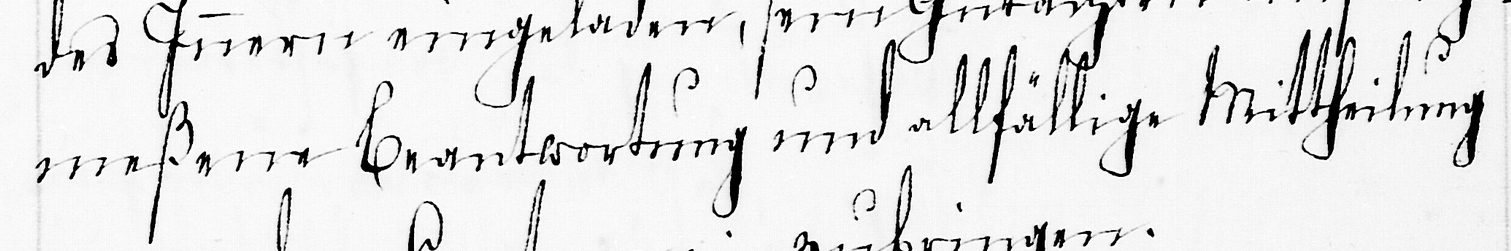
meßene Beantwortung und allfällige Mittheilung
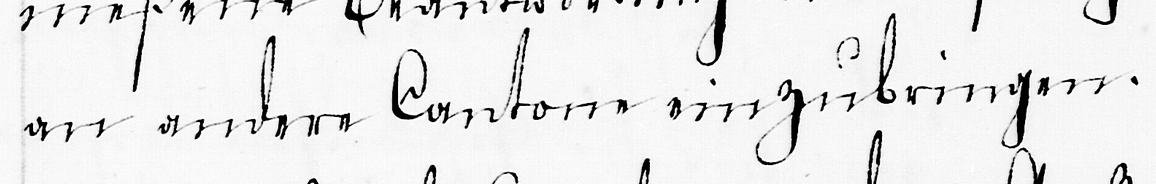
an andere Cantone einzubringen.
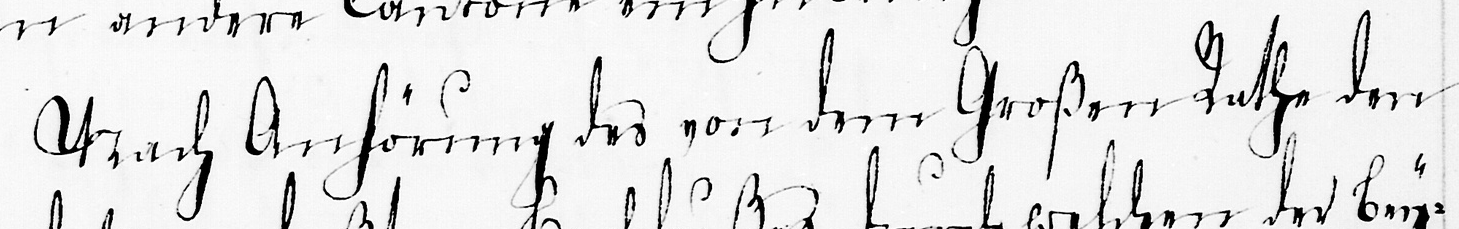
Nach Anhörung des von dem Großen Rathe den
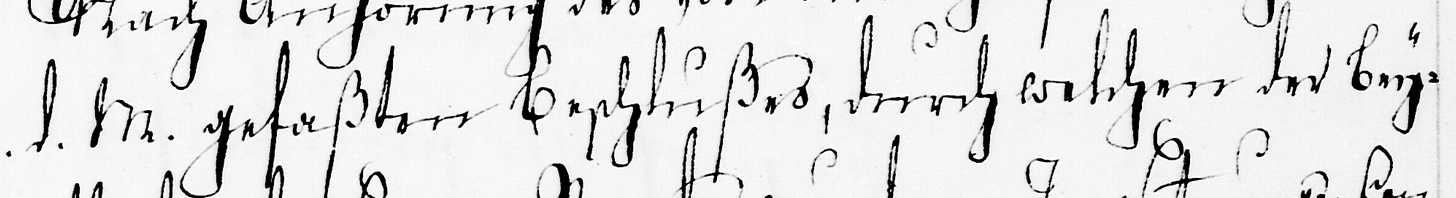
d. M. gefaßten Beschlußes, durch welchen der Bey¬
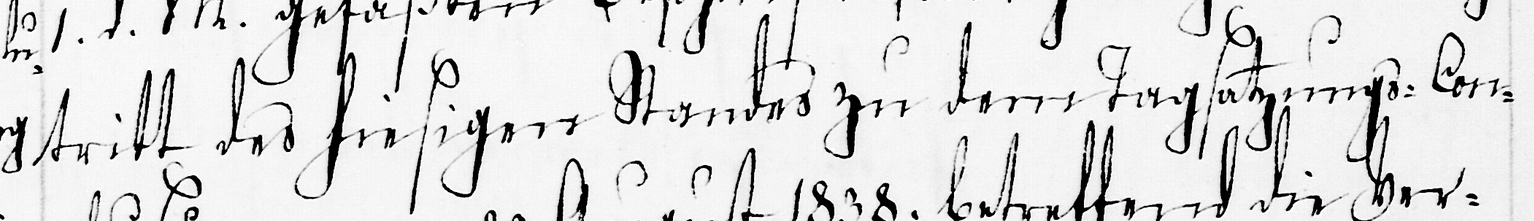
tritt des hiesigen Standes zu dem Tagsatzungs-Con¬
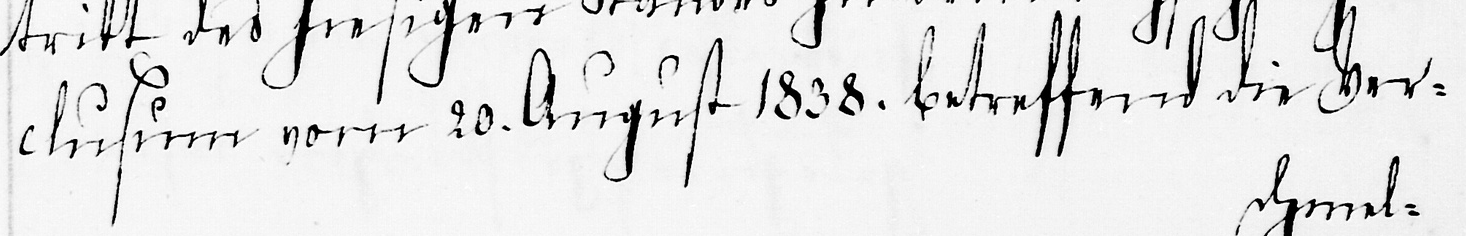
clusum vom 20. August 1838. betreffend die Ver-
